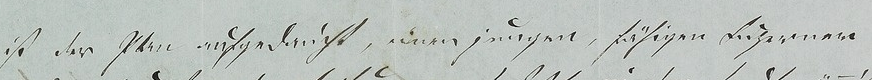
ist der Plan aufgedaucht, einen jungen, fähigen Luzerner
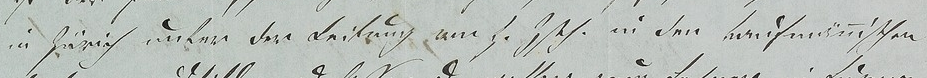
in Zürich unter der Leitung von H. Zsch. in den kaufmännischen
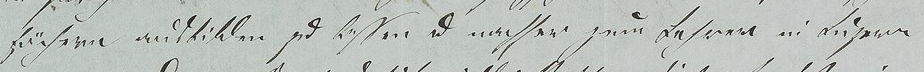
Fächern ausbilden zu lassen u nachher zum Lehrer in Luzern
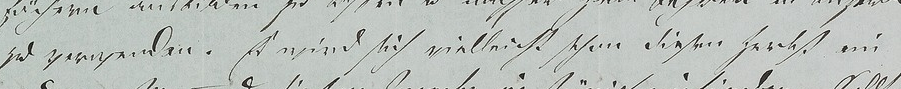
zu verwenden. Es wird sich vielleicht schon diesen Herbst ein
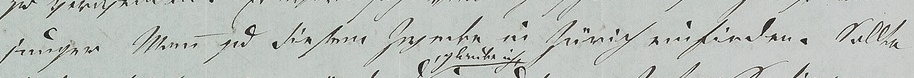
junger Mann zu diesem Zwecke in Zürich einfinden. Sollte
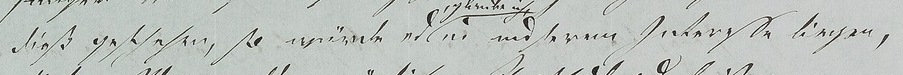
dieß geschehen, so würde es, glaube ich, in unserem Interesse liegen,
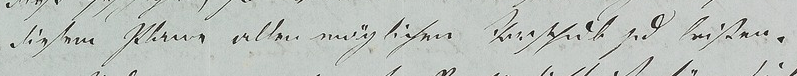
diesem Plane allen möglichen Vorschub zu leisten.
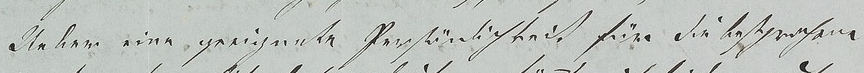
Ueber eine geeignete Persönlichkeit für die besprochene
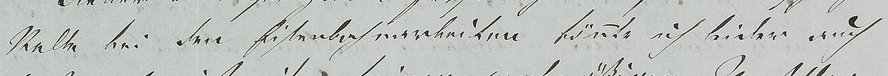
Stelle bei den Eisenbahnarbeiten könnte ich leider auch
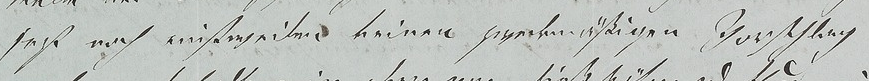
jezt noch einstweilen keinen zweckmäßigen Vorschlag
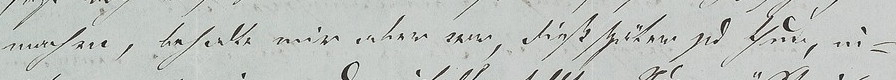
machen, behalte mir aber vor, dieß später zu thun, in-
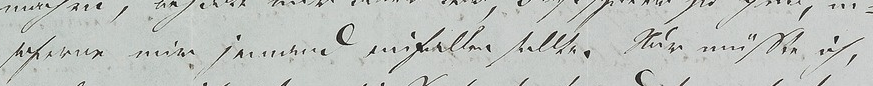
soferne mir jemand einfallen sollte. Nur müsste ich,
